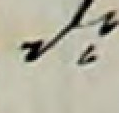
Do
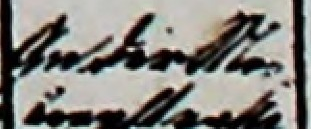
An der Mos„
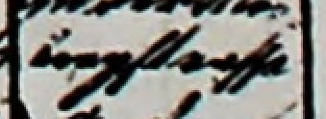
bergstrasse
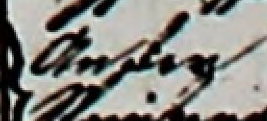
An der
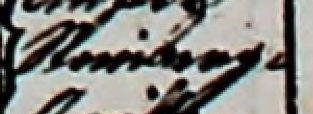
Steinberg„
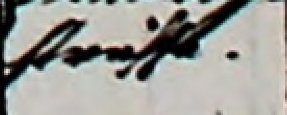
strasse
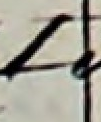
I
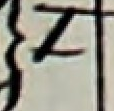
I
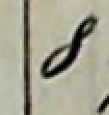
8
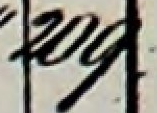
209
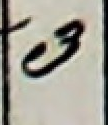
3
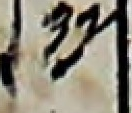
37
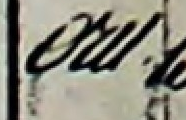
Alt
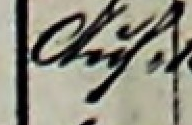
Aus„
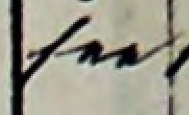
see
